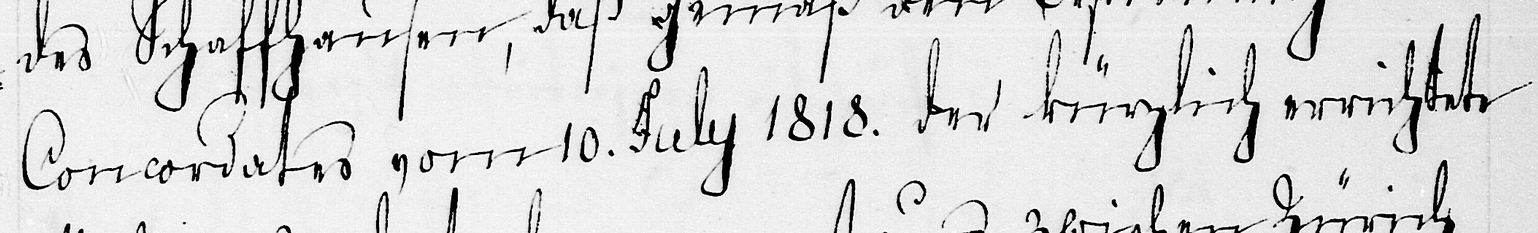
Concordates vom 10. July 1818. der kürzlich errichtete
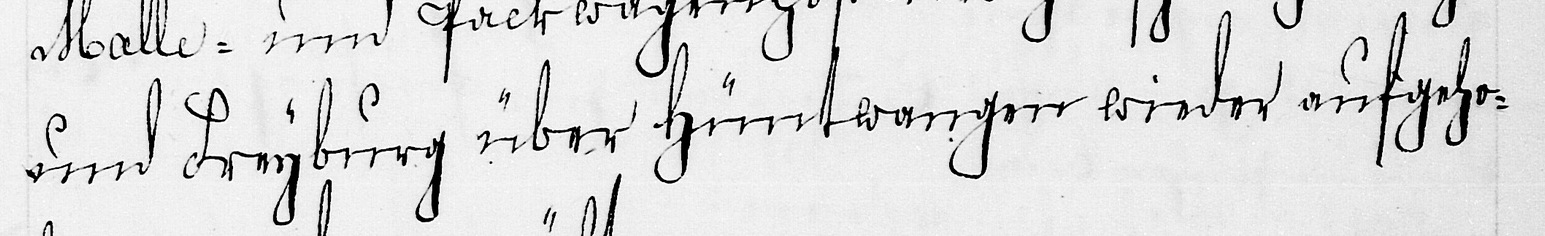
und Freyburg über Hüntwangen wieder aufgeho¬
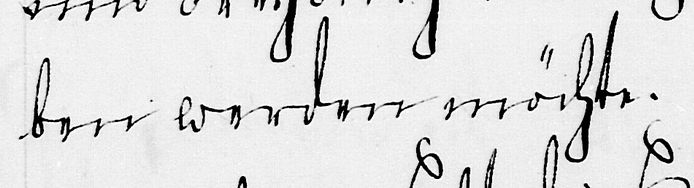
ben werden möchte.
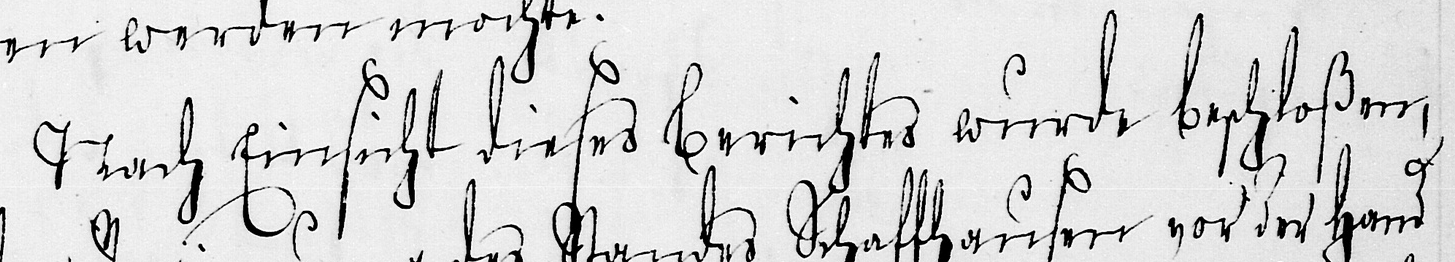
Nach Einsicht dieses Berichtes wurde beschloßen,
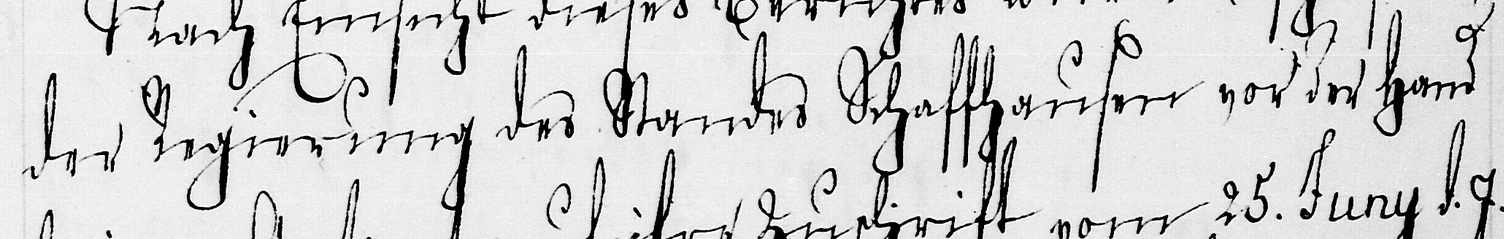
der Regierung des Standes Schaffhausen vor der Hand
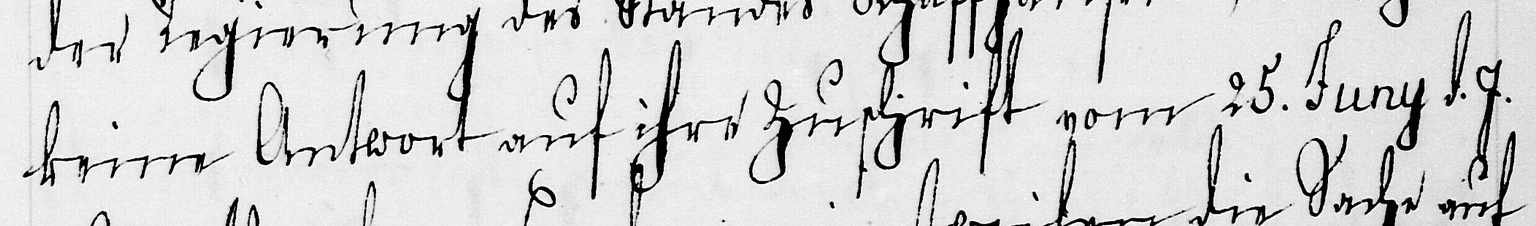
keine Antwort auf ihre Zuschrift vom 25. Juny d. J.
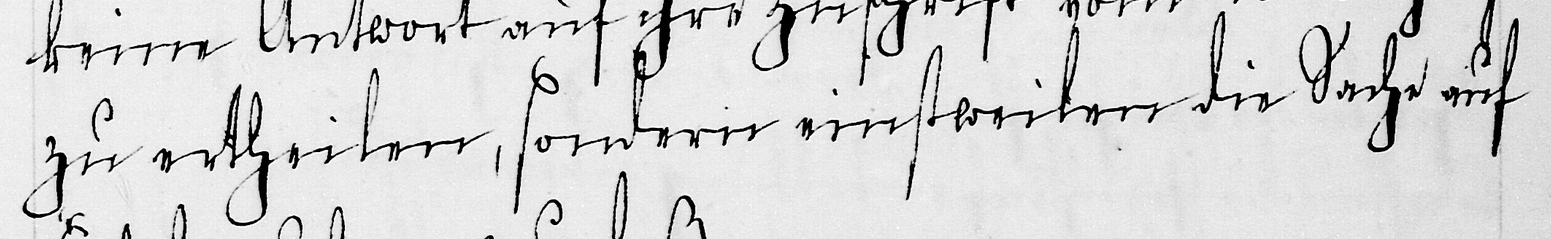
zu ertheilen, sondern einstweilen die Sache auf
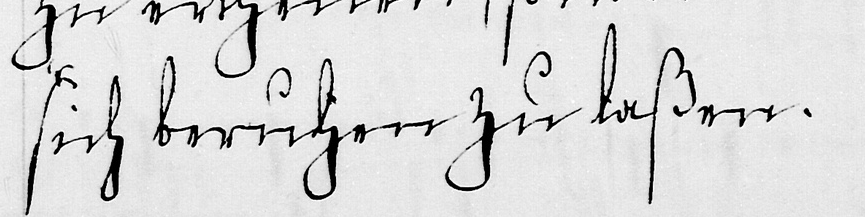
sich beruhen zu laßen.
